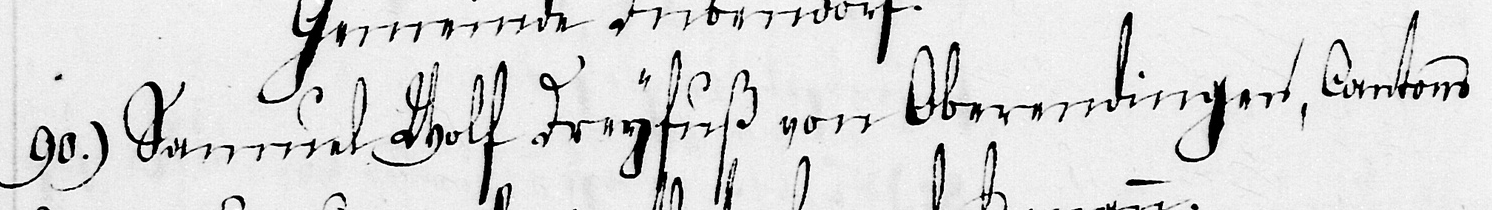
90.) Samuel Wolf Dreyfuß von Oberendingen, Cantons
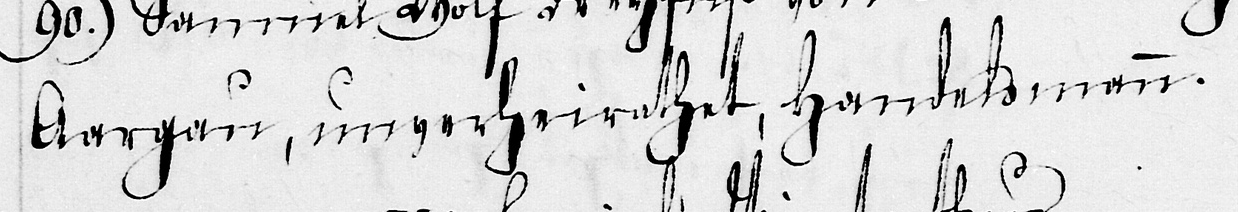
Aargau, unverheirathet, Handelsmann.
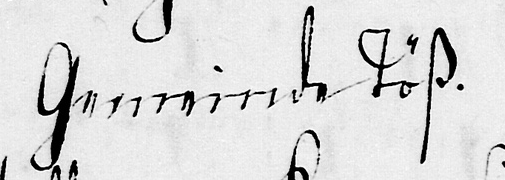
Gemeinde Töß.
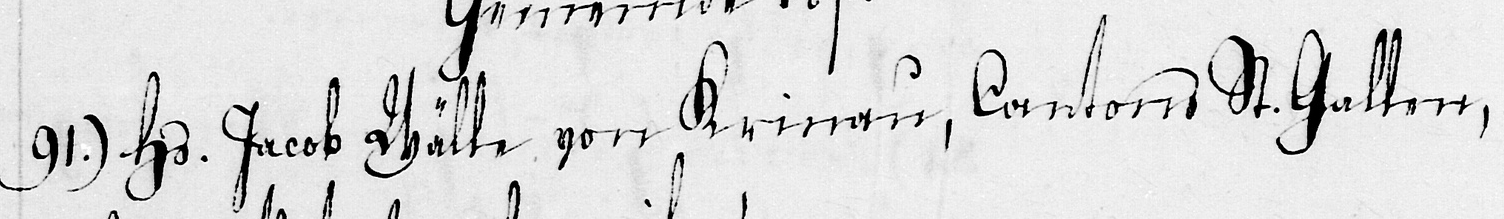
91.) Hs. Jacob Wälle von Krinau, Cantons St. Gallen,
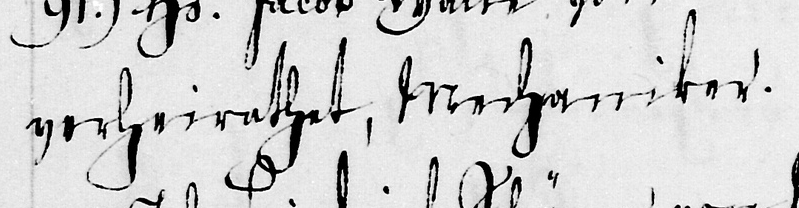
verheirathet, Mechaniker.
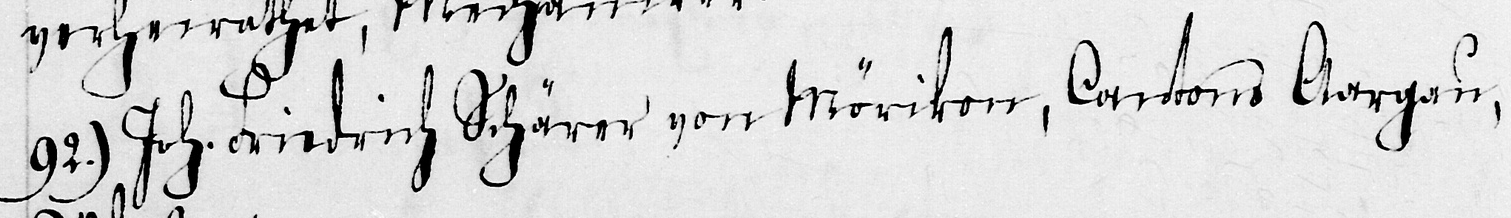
92.) Joh. Friedrich Schärer von Mörikon, Cantons Aargau,
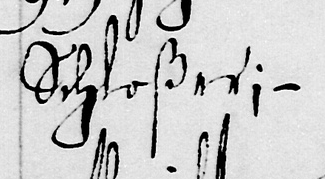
Schloßer;
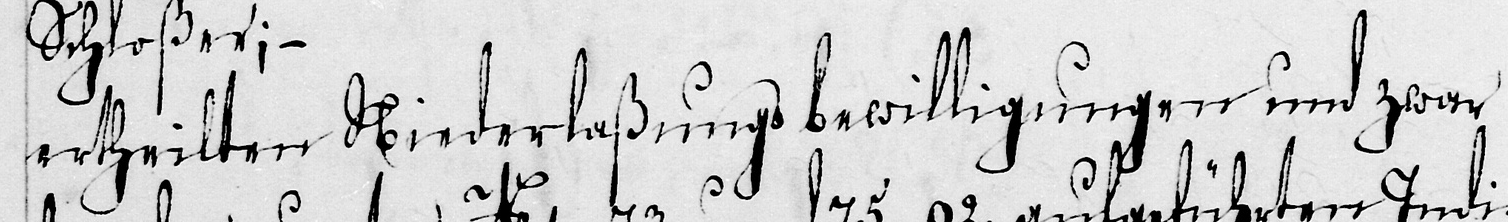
ertheilten Niederlaßungsbewilligungen und zwar
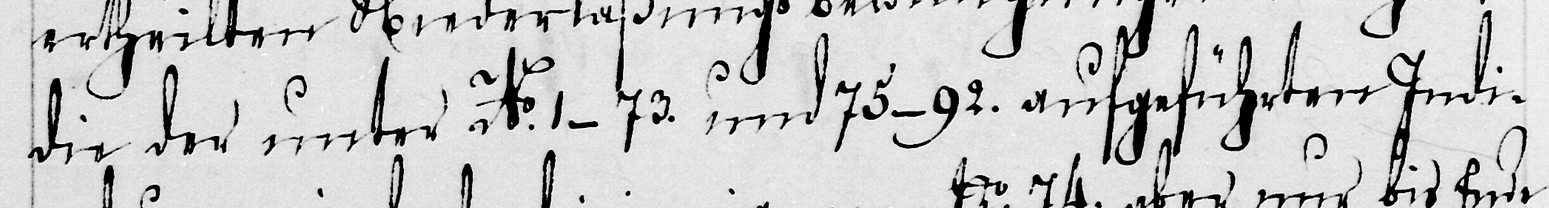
die der unter No. 1–73. und 75–92. aufgeführten Indi¬
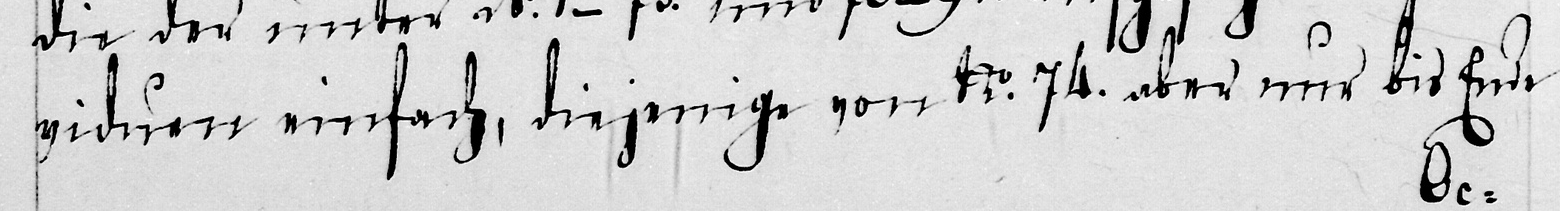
viduen einfach, diejenige von No. 74. aber nur bis Ende
